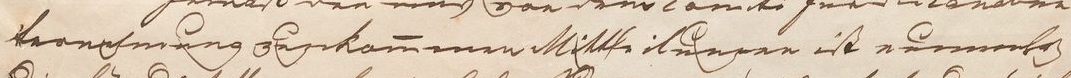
ternehmung zugekommenen Mittheilungen ist nunmehr
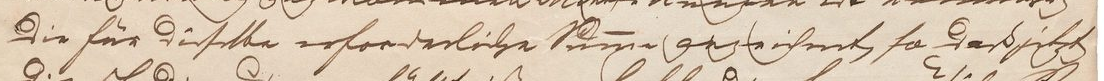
die für dieselbe erforderliche Summe gezeichnet, so daß jetzt
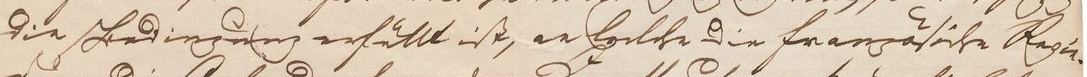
die Bedingung erfüllt ist, an welche die französische Regie-
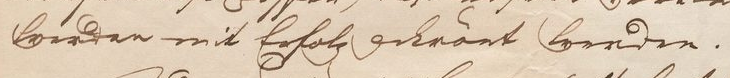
werden mit Erfolg gekrönt werden.
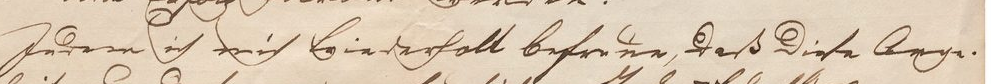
Indem ich mich wiederholt befreue, daß diese Ange-
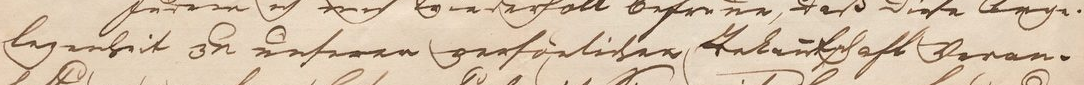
legenheit zu unserer persönlichen Bekanntschaft Veran-
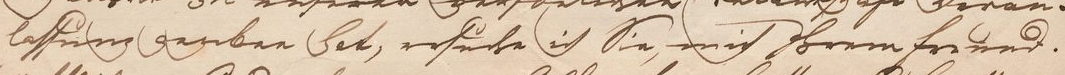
lassung gegeben hat, ersuche ich Sie, mich Ihrem freund-
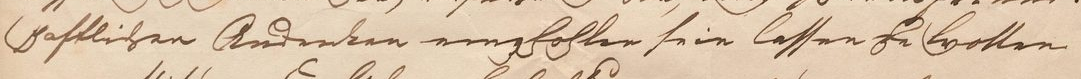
schaftlichen Andenken empfohlen sein lassen zu wollen
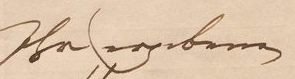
Ihr ergebener
